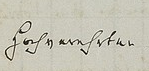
Hochverehrter
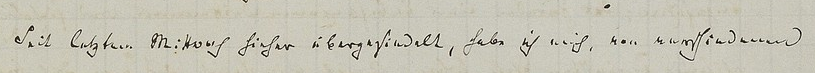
Seit letzten Mittwoch hieher übergesiedelt, habe ich mich, von verschiedenen
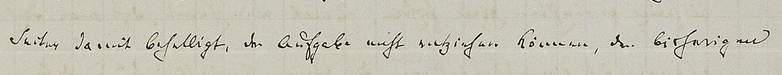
Seiten damit behelligt, der Aufgabe nicht entziehen können, den bisherigen
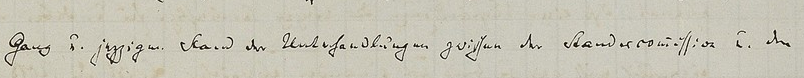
Gang u. jezzigen Stand der Unterhandlungen zwischen der Standescommission u. der
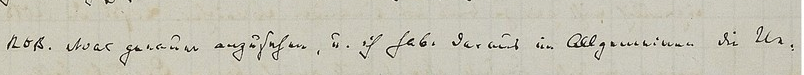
NOB. etwas genauer anzusehen, u. ich habe daraus im Allgemeinen die Ue-
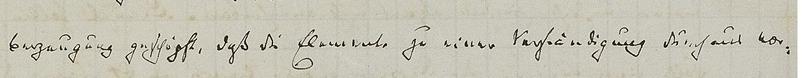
berzeugung geschöpft, daß die Elemente zu einer Verständigung durchaus vor-
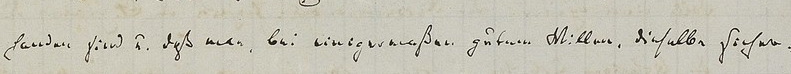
handen sind u. daß man, bei einigermaßen gutem Willen, dieselbe sicher-
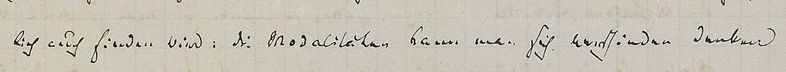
lich auch finden wird: die Modalitäten kann man sich verschieden denken
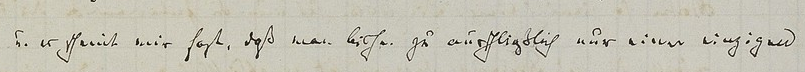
u. es scheint mir fast, daß man bisher zu ausschließlich nur einer einzigen
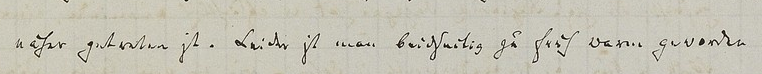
näher getreten ist. Leider ist man beidseitig zu früh warm geworden –
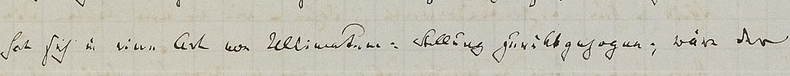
hat sich in einer Art von Ultimatum-Stellung zurükkgezogen; wäre der
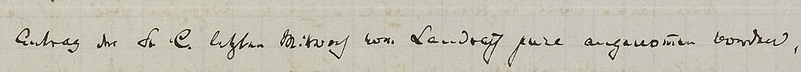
Antrag der St.C. letzten Mittwoch vom Landrath pure angenommen worden,
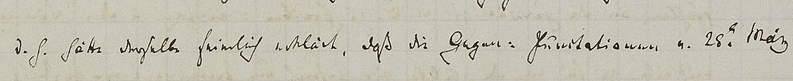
d. h. hätte derselbe heimlich erklärt, daß die Gegen-Punctationen v. 28ten März
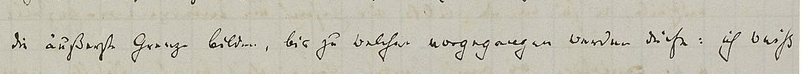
die äußerste Grenze bilden, bis zu welcher vorgegangen werden dürfe: ich weiß
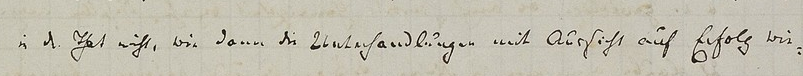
in d. That nicht, wie dann die Unterhandlungen mit Aussicht auf Erfolg wie-
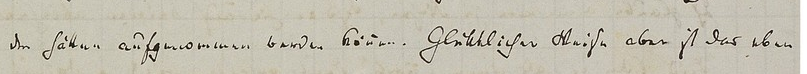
der hätten aufgenommen werden können. Glükklicher Weise aber ist das eben
